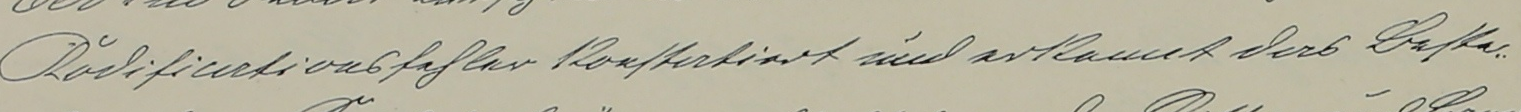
Kodificationsfehler konstatiert und erkennt das Beste-
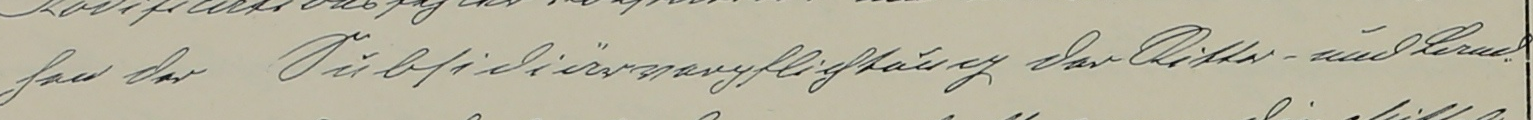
hen der Subsidiärverpflichtung der Ritter- und Land-
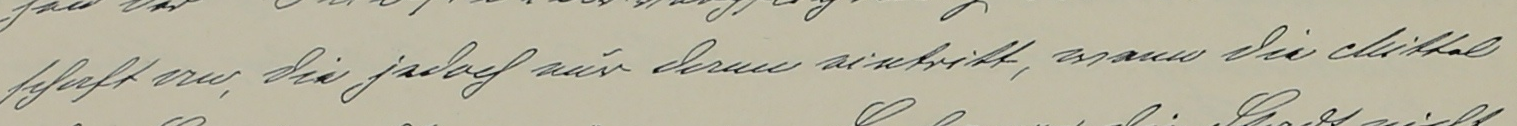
schaft an, die jedoch nur dann eintritt, wenn die Mittel
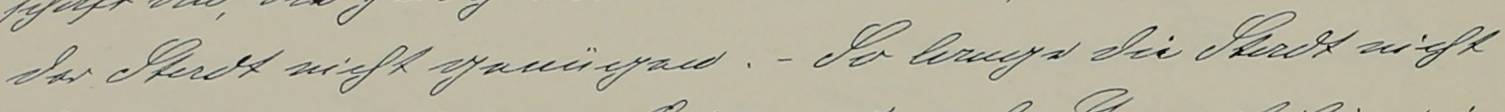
der Stadt nicht genügen. - So lange die Stadt nicht
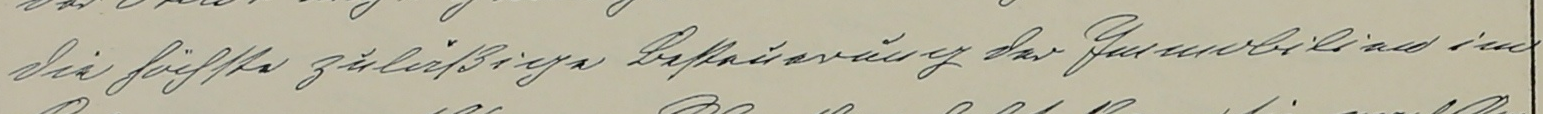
die höchste zuläßige Besteuerung der Immobilien im
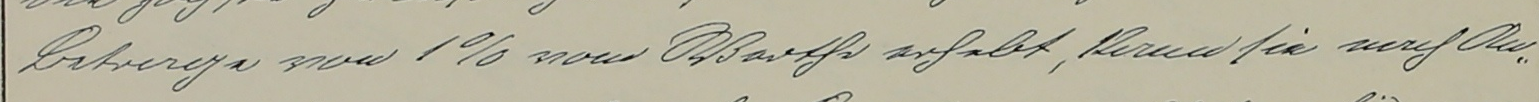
Betrage von 1% vom Werthe erhebt, kann sie nach An-
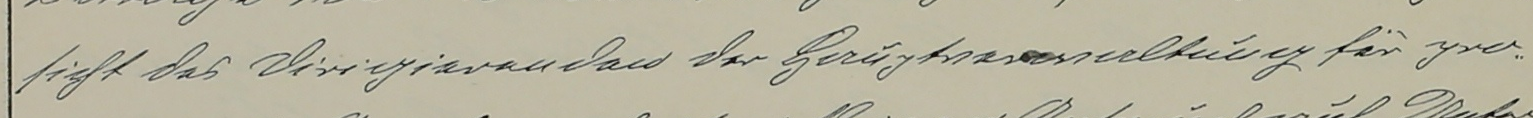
sicht des Dirigierenden der Hauptverwaltung für pro-
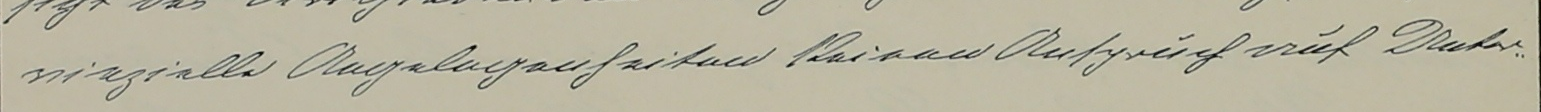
vinzielle Angelegenheiten keinen Anspruch auf Unter-
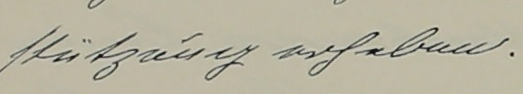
stützung erheben.
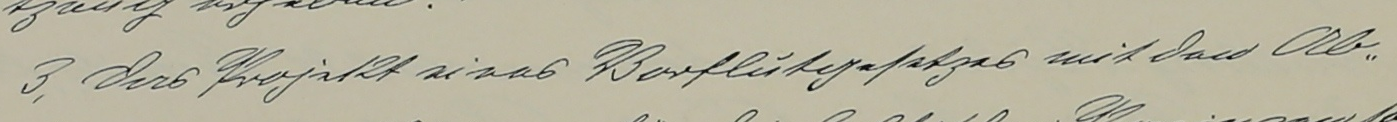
3. Das Projekt eines Vorflutgesetzes mit den Ab-
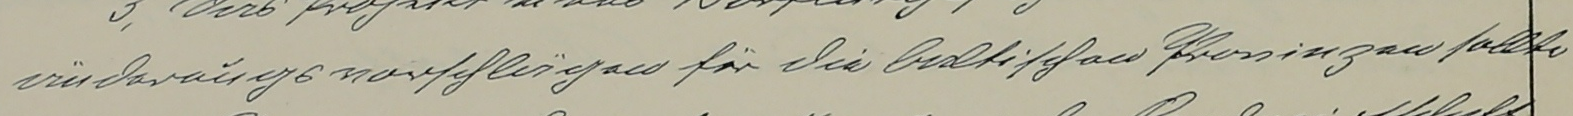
änderungsvorschlägen für die baltischen Provinzen sollte
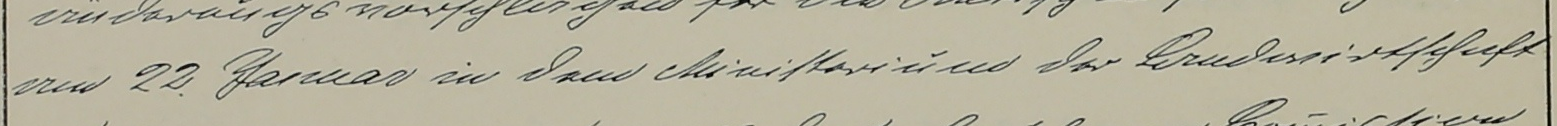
am 22. Januar in dem Ministerium der Landwirtschaft
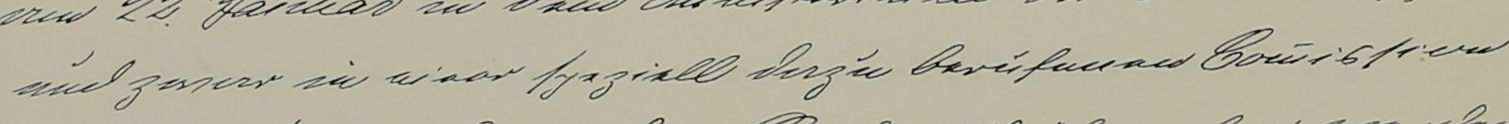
und zwar in einer speziell dazu berufenen Commission
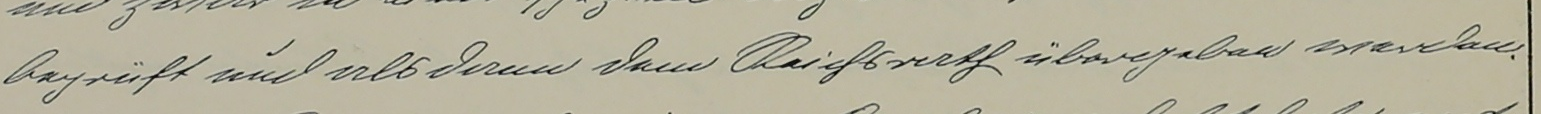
beprüft und alsdann dem Reichsrath übergeben werden.
